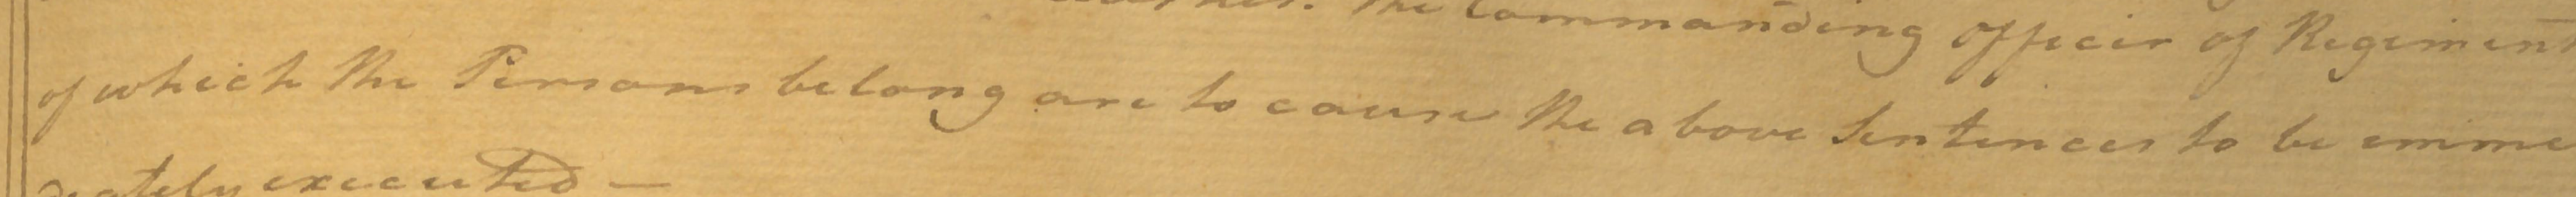of which the Persons belong are to cause the above Sentences to be imme
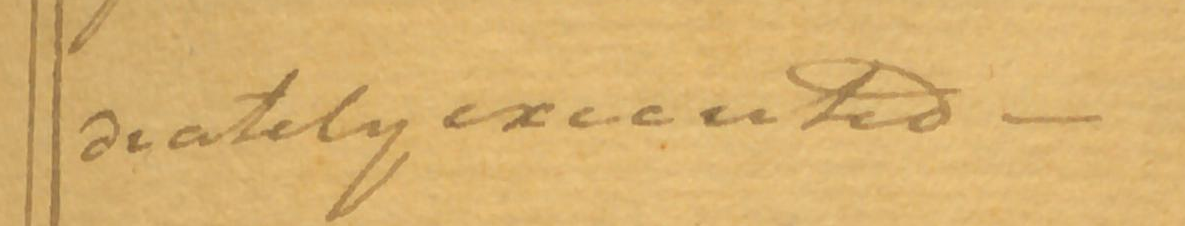diately executed-
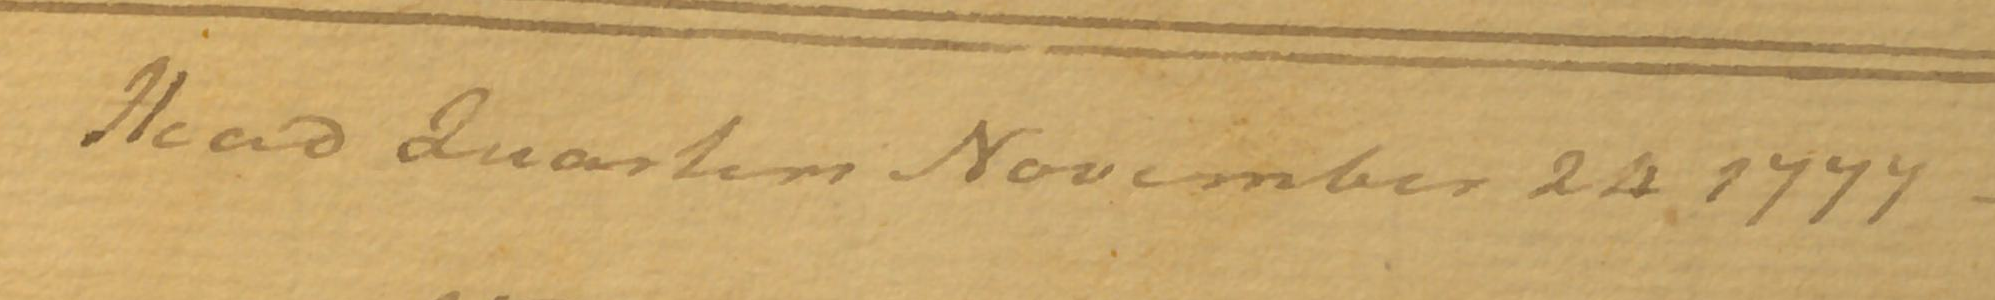Head Quarters November 24 1777
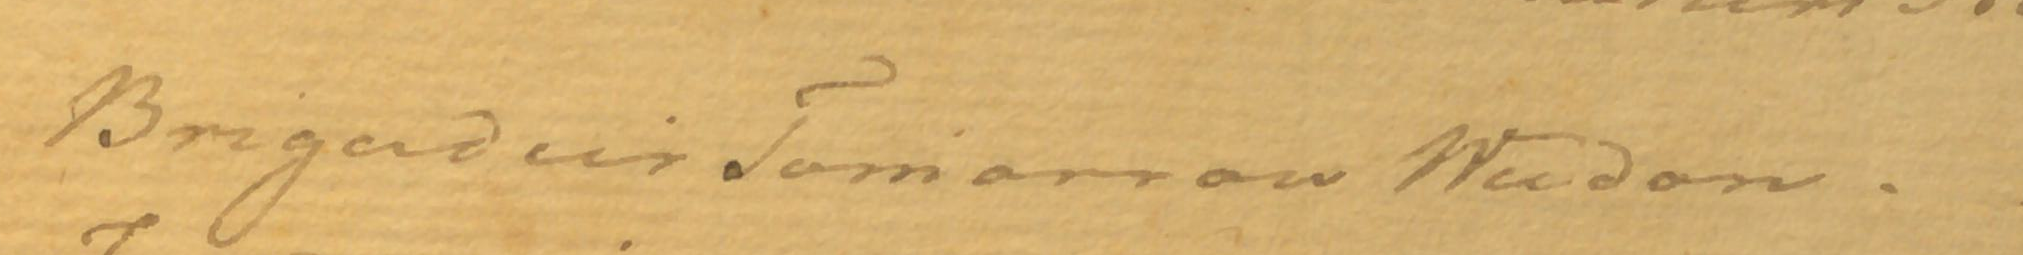Brigadier Tomorrow Weedon.
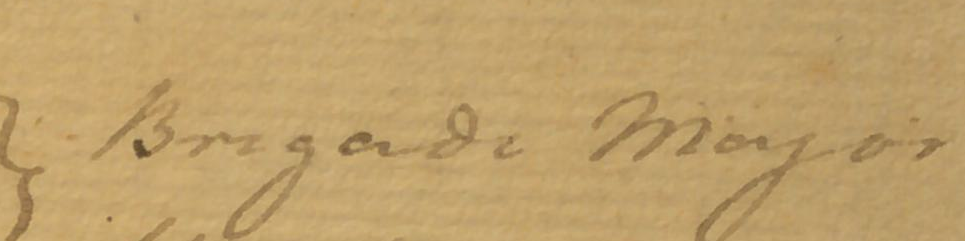Brigade Major
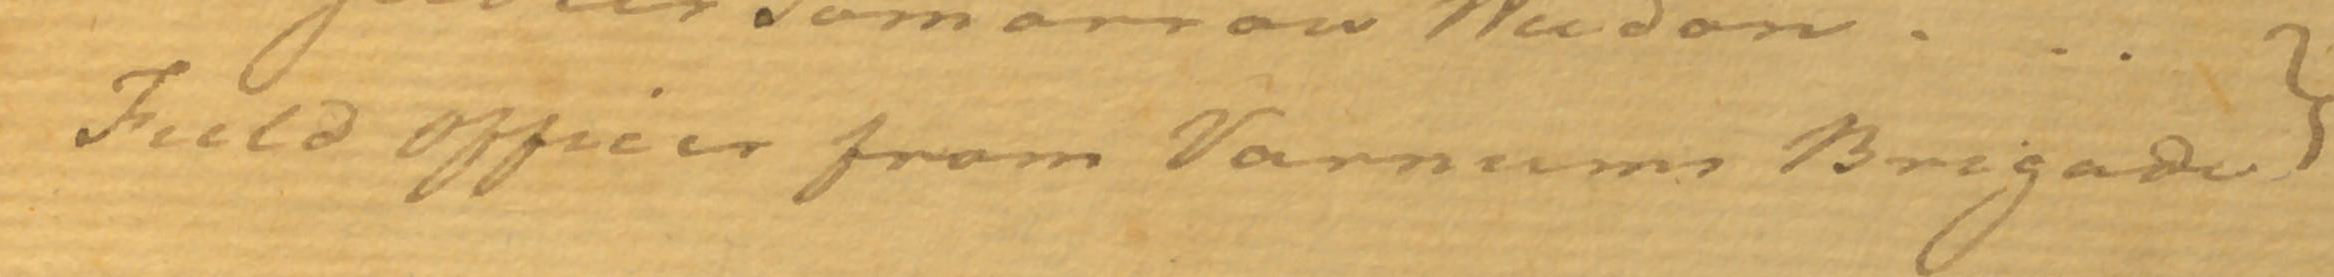Field Officer from Varnums Brigade
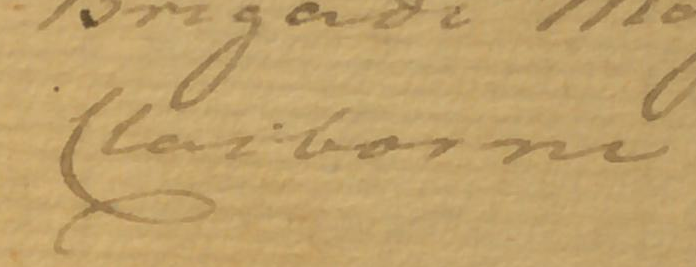Claiborne
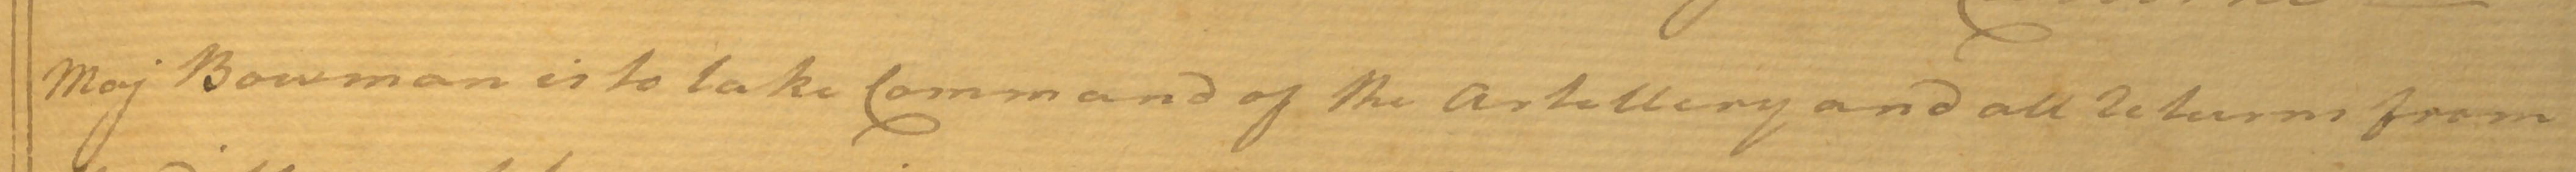Maj Bowman is to take Command of the artillery and all returns from
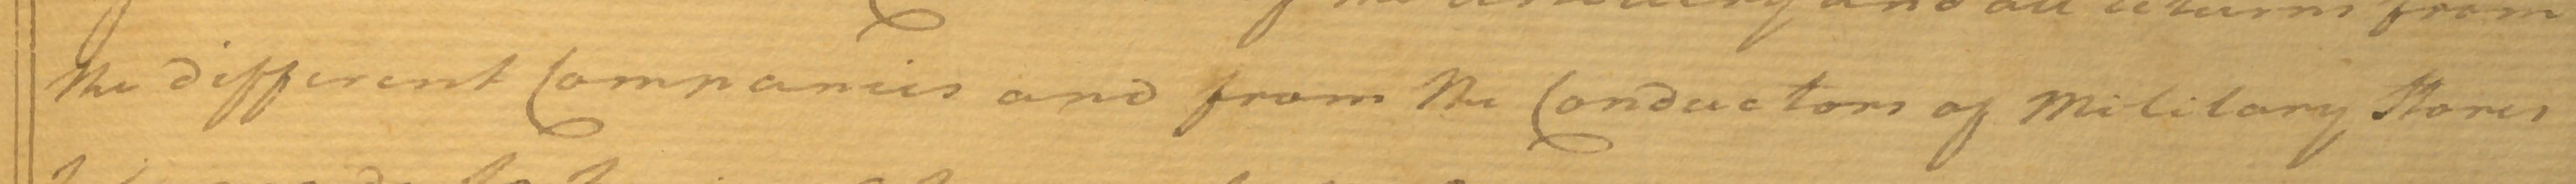the different Companies and from the Conductors of Military Horses
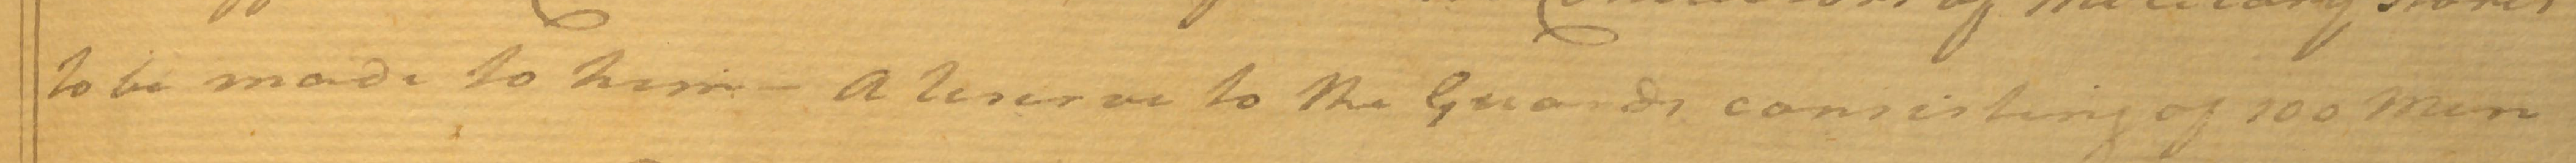to be made to him- A reserve to the Guards consisting of 100 Men
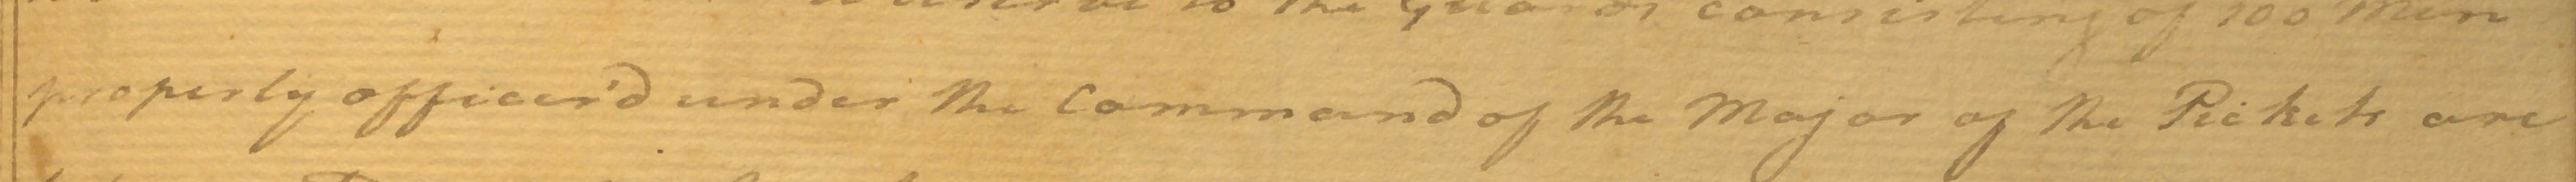properly officer'd under the Command of the Major of the Pickets are
